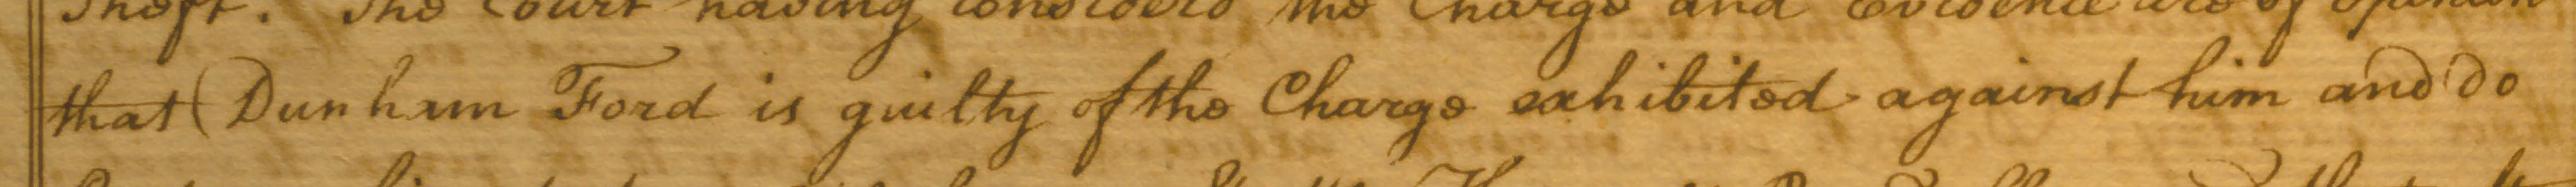that Dunham Ford is guilty of the Charge exhibited against him and do
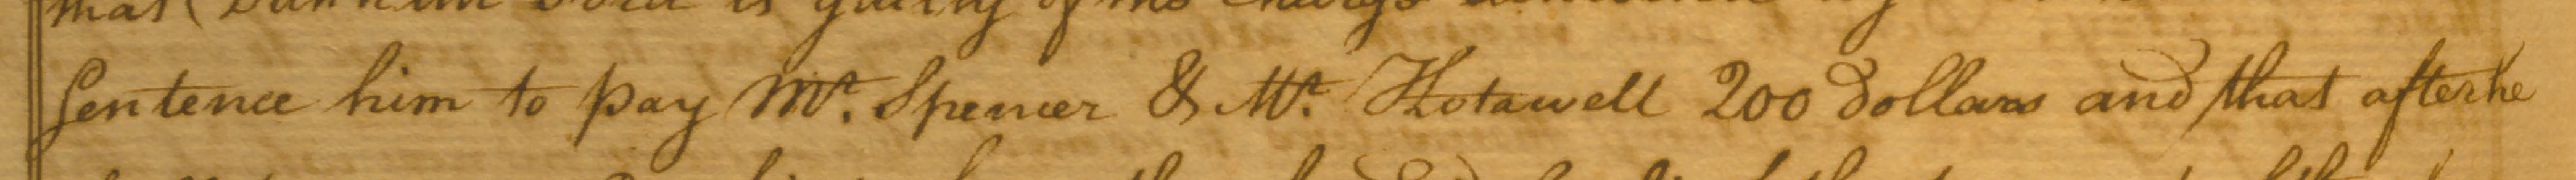Sentence him to pay M^r. Spencer & M^r. Hotawell 200 dollars and that after he
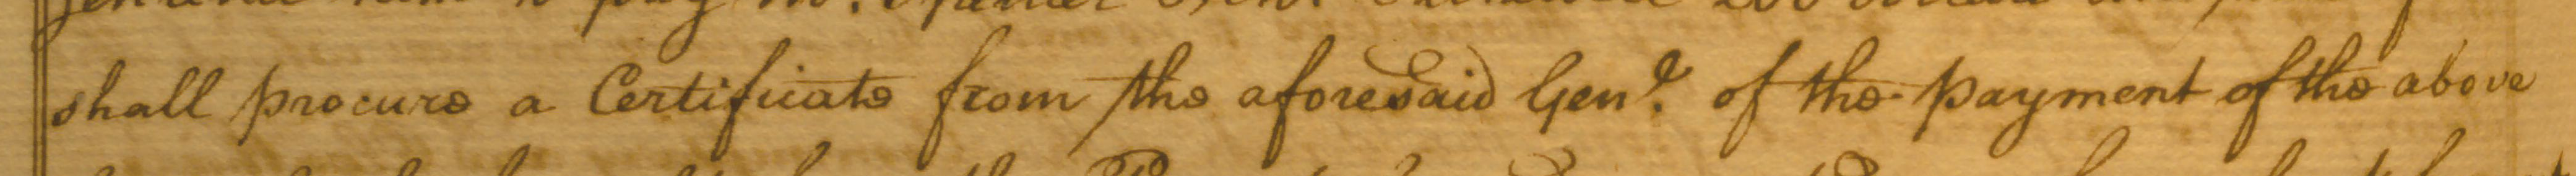shall procure a Certificate from the aforesaid Gen^l. of the payment of the above
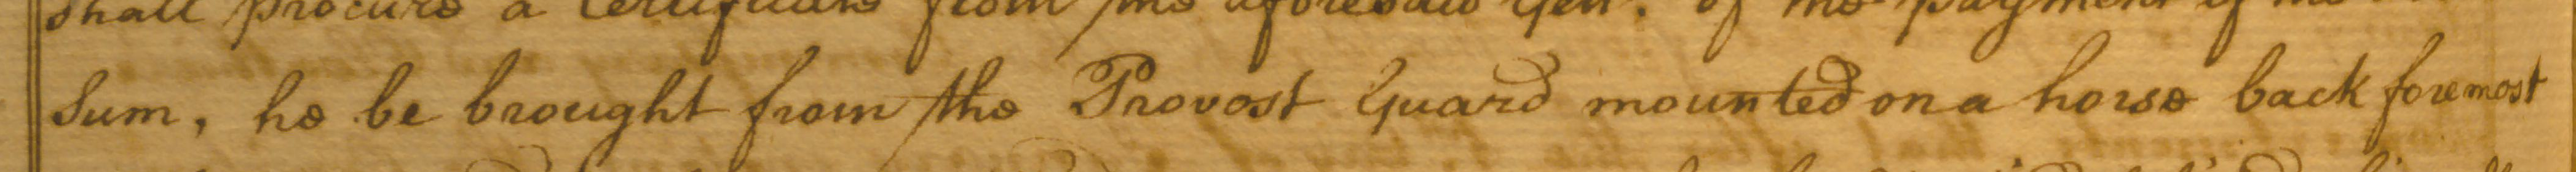sum, he be brought from the Provost Guard mounted on a horse back foremost
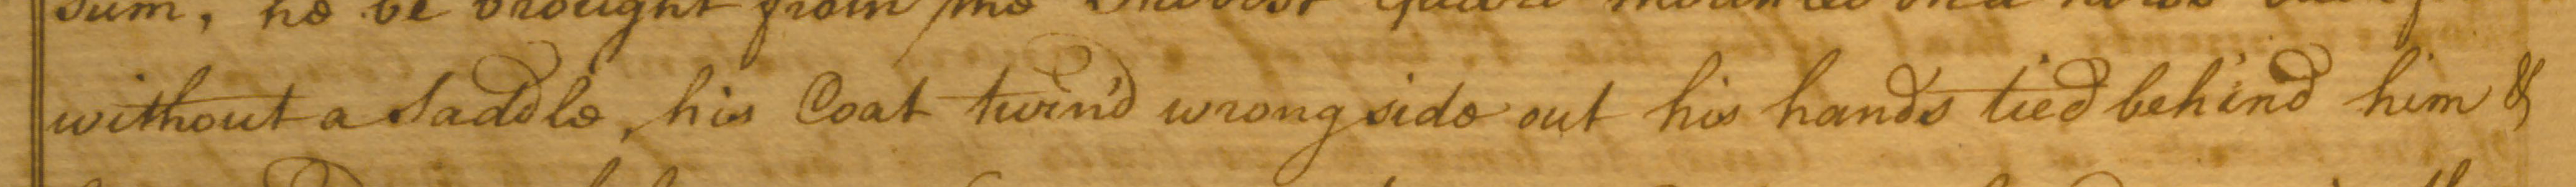without a Saddle, his Coat turn'd wrong side out his hands tied behind him &
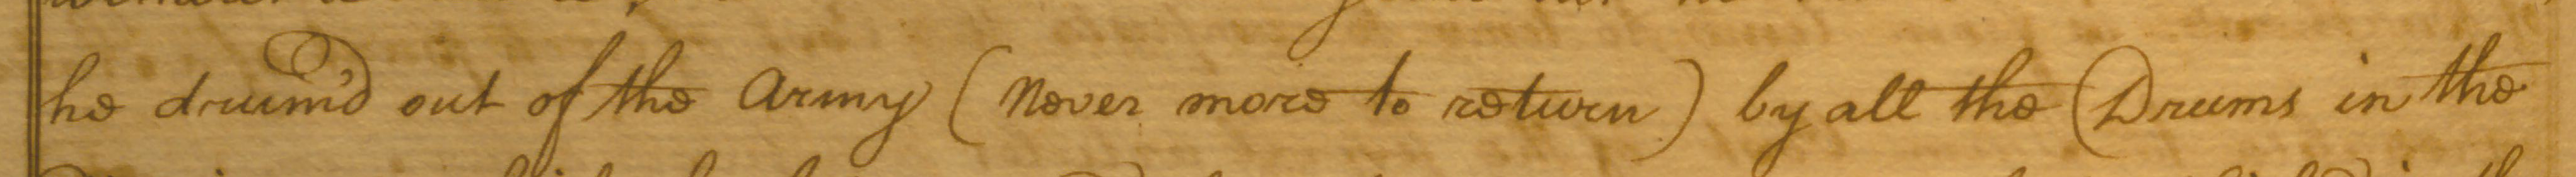he drum'd out of the army (never more to return) by all the Drums in the
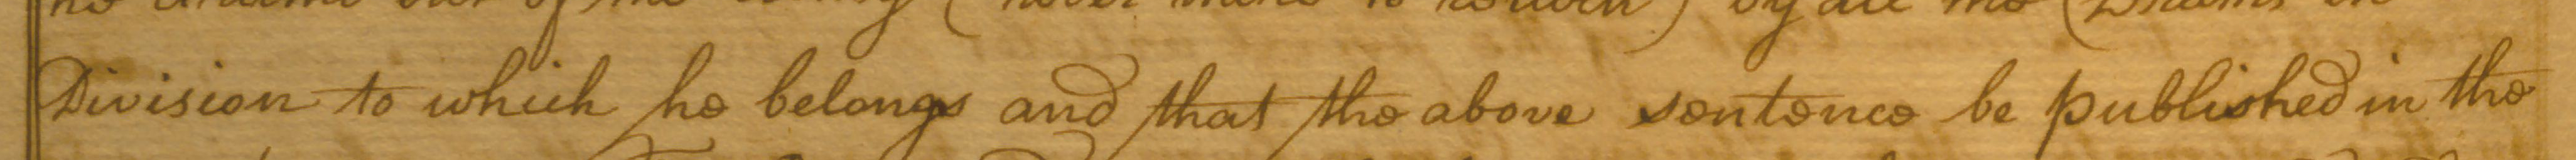Division to which he belongs and that the above sentence be published in the
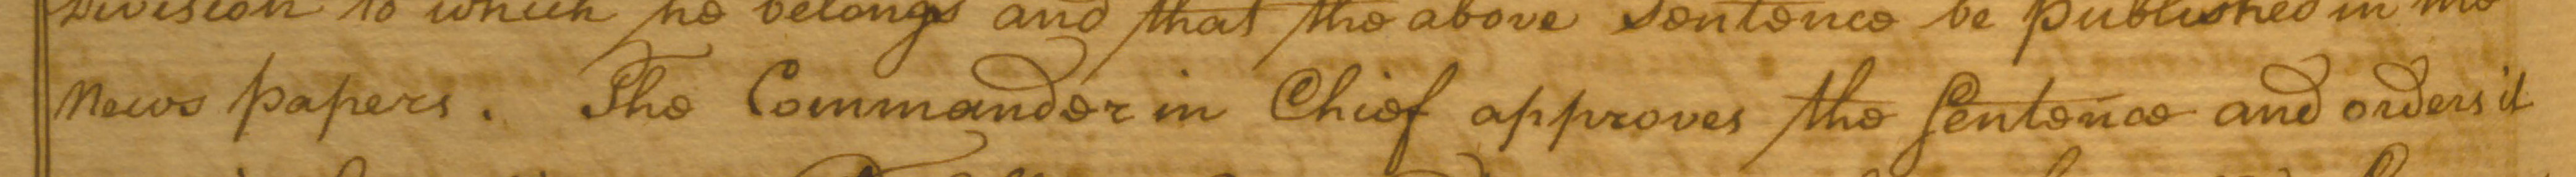news papers. The Commander in Chief approves the sentence and orders it
